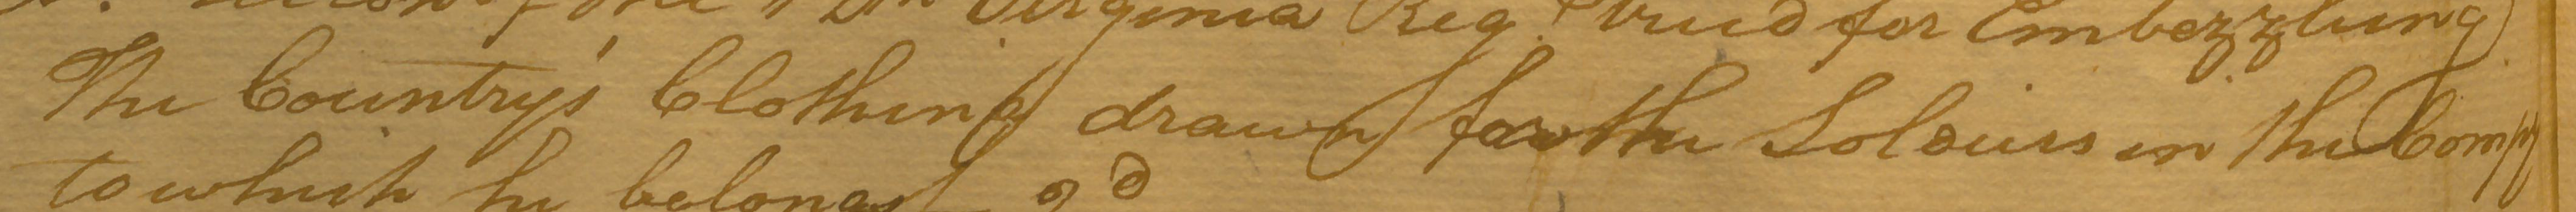The Country's Clothing drawn for the Soldiers on the Compy
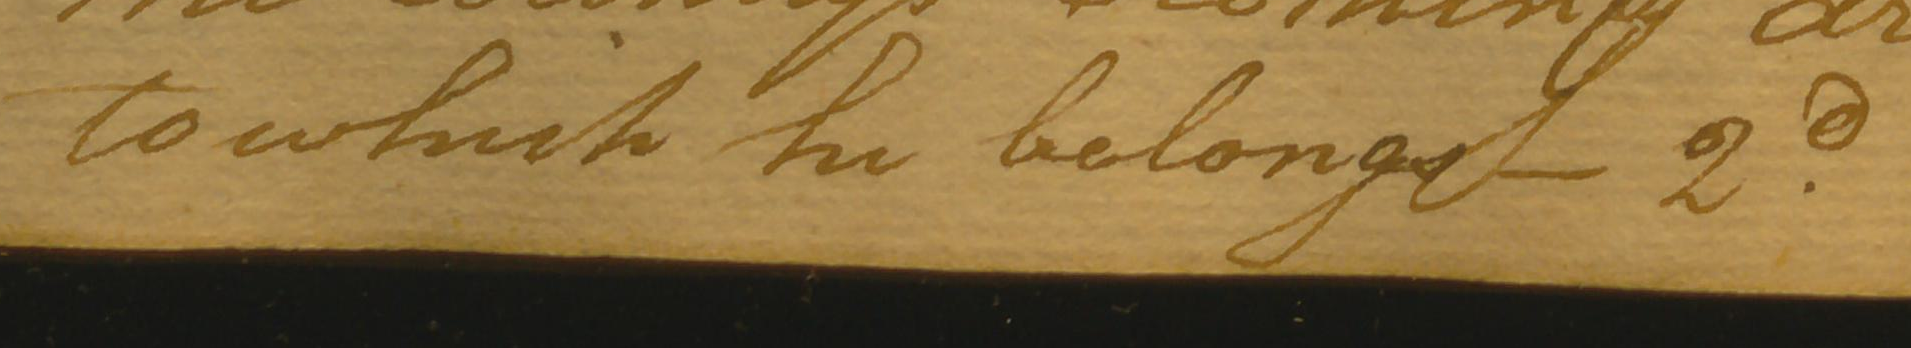to which he belongs- 2^d.
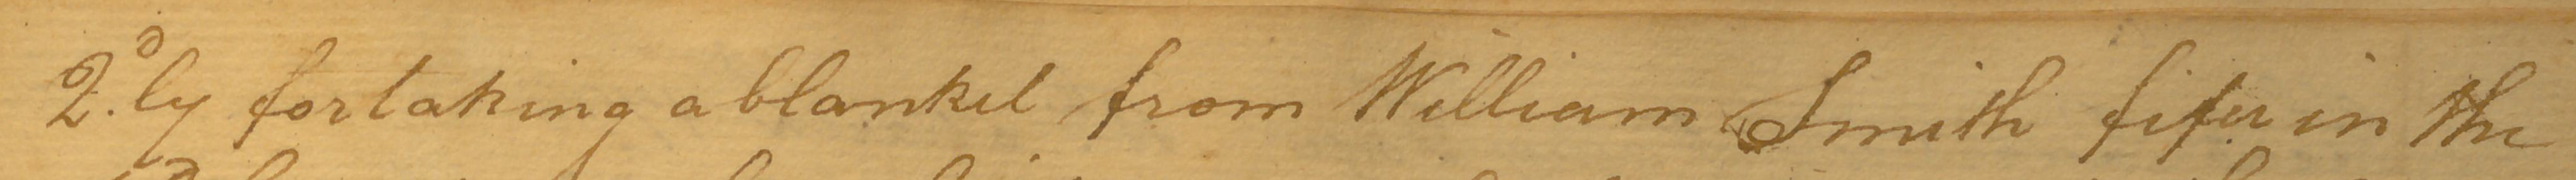2^d.ly for taking a blanket from William Smith fifer in the
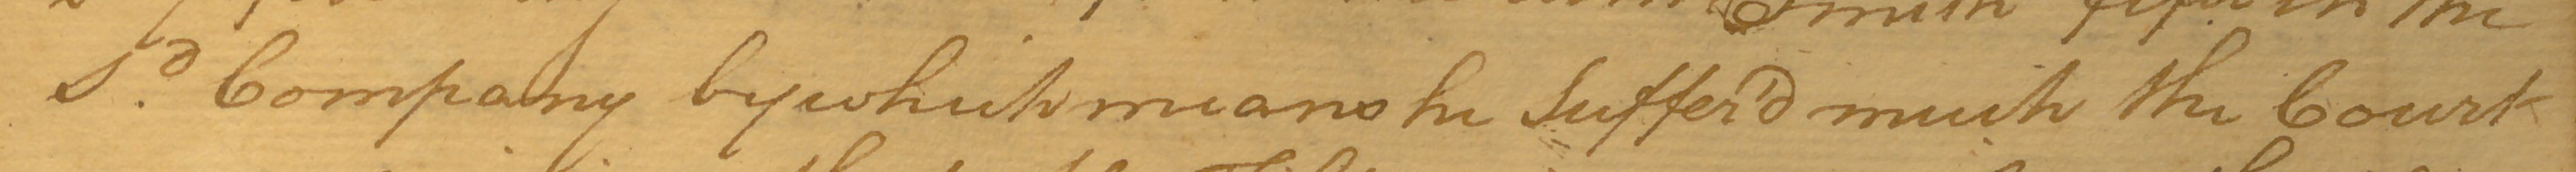s^d. Company by which means he suffer'd much the Court
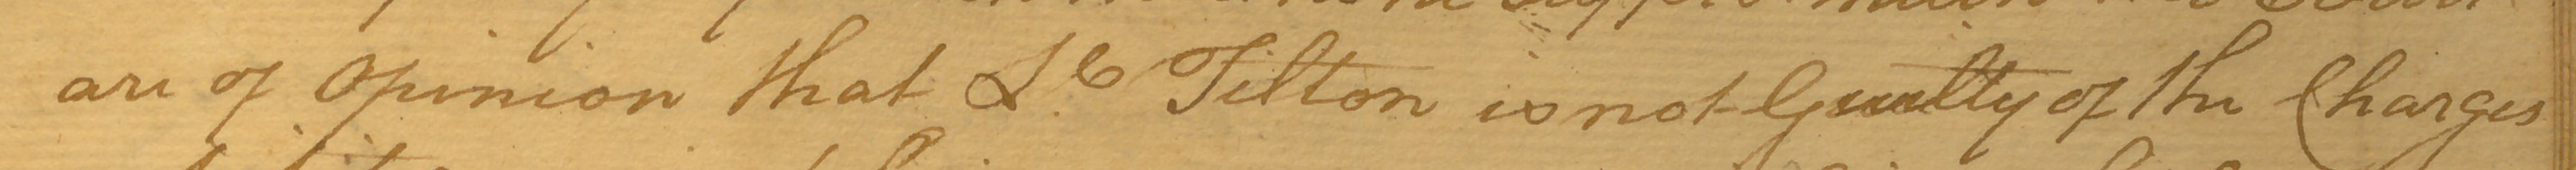are of opinion that L^t. Tilton is not Guilty of the Charges
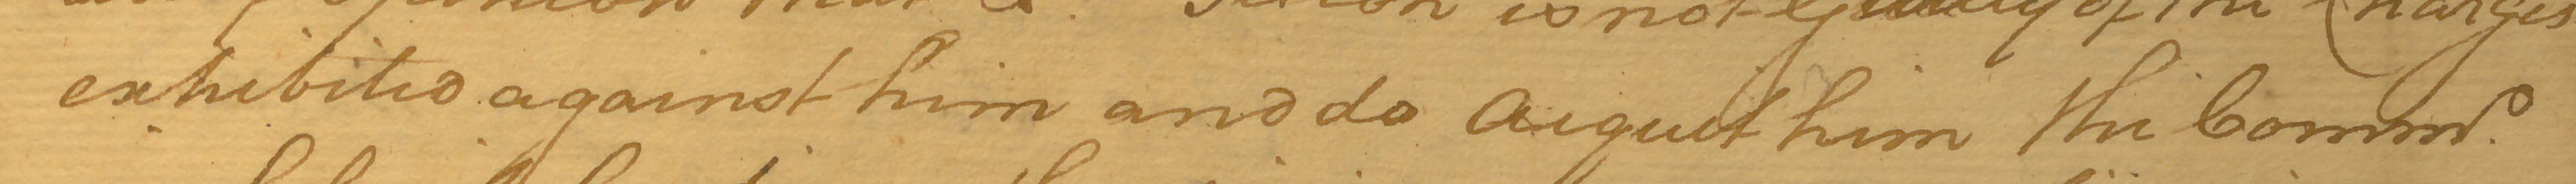exhibited against him and do acquit him the Comm^r.
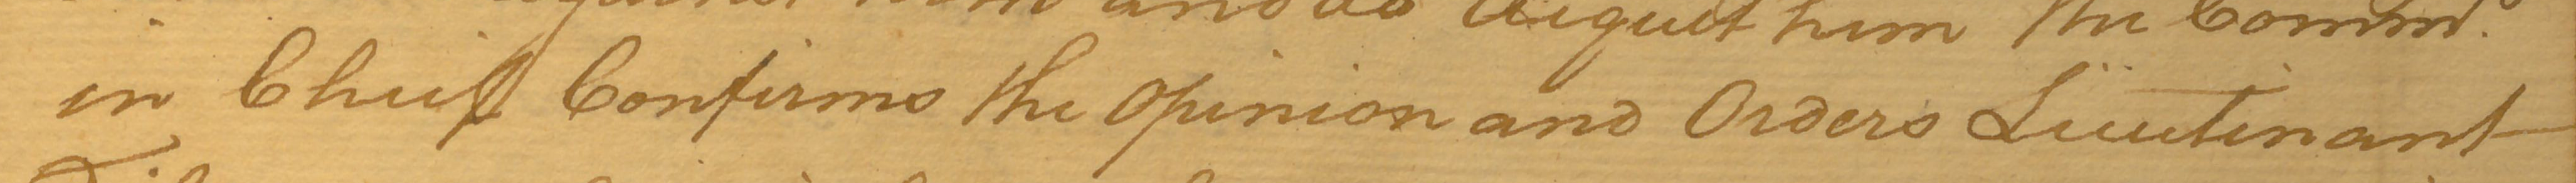in Chief Confirms the opinion and Orders Lieutenant
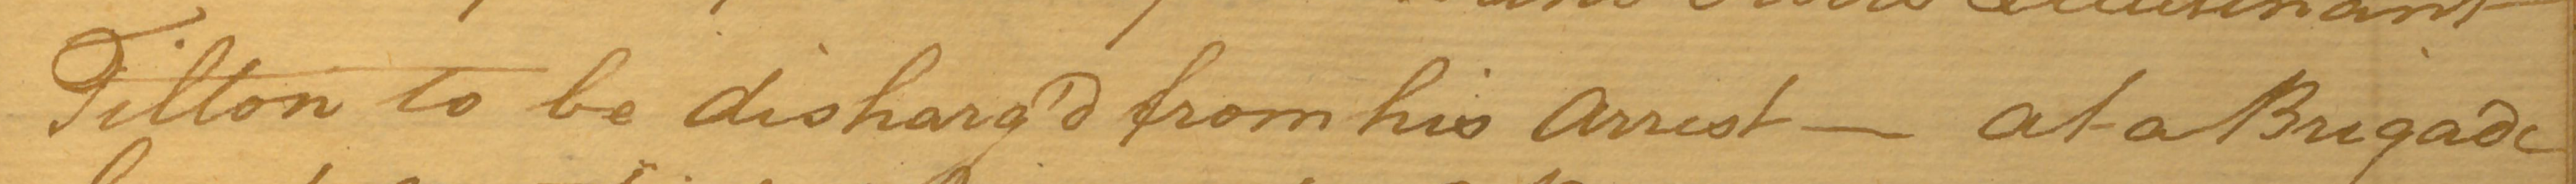Tilton to be discharg'd from his arrest- at a Brigade
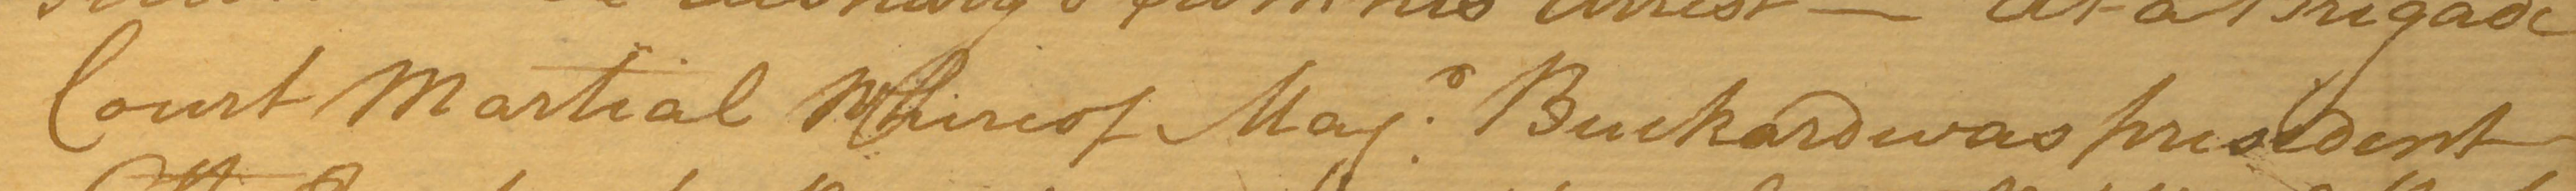Court Martial thereof Maj^r. Buckard was president
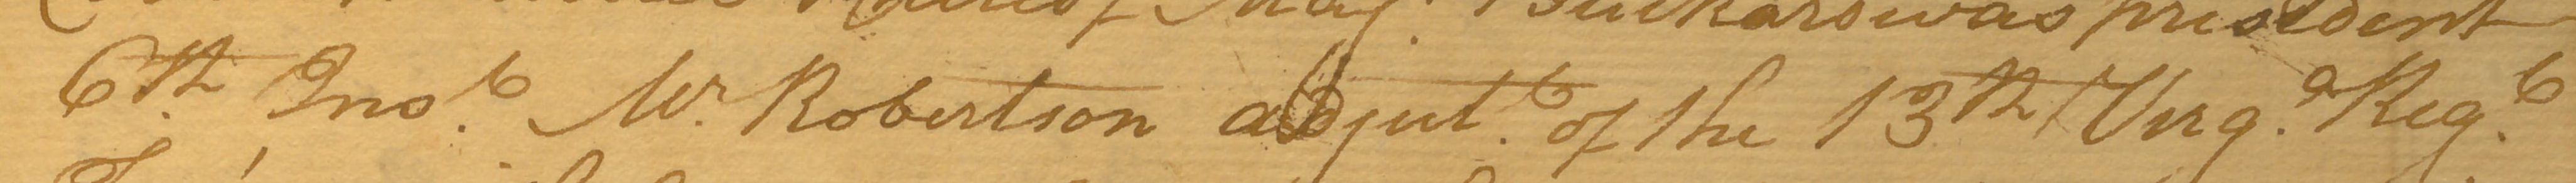6^th. Ins^t. M^r. Robertson adjut^t. of the 13^th. Virg^a. Reg^t.
